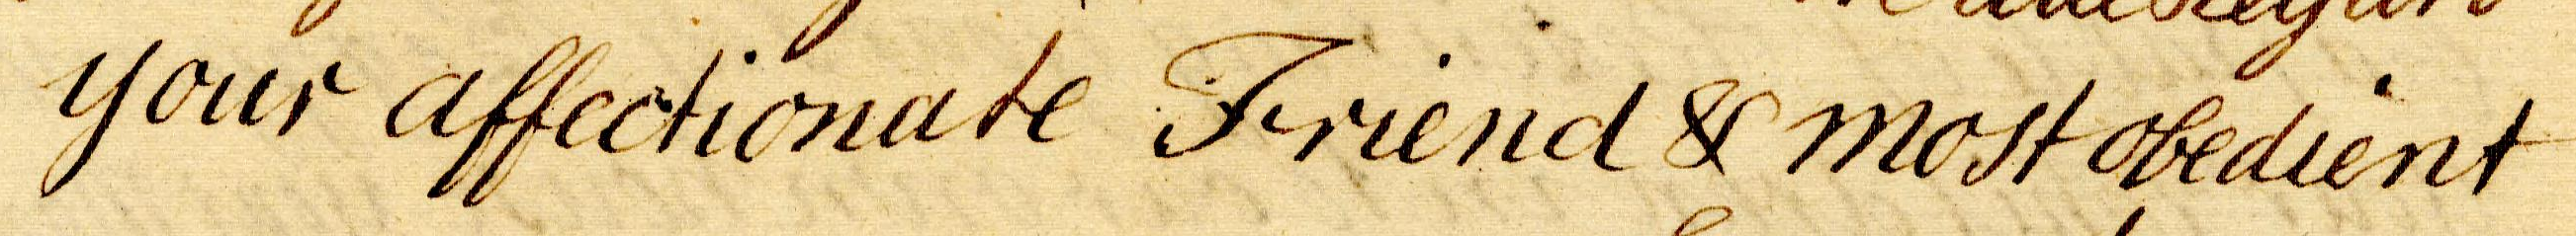Your affectionate Friend & most obedient
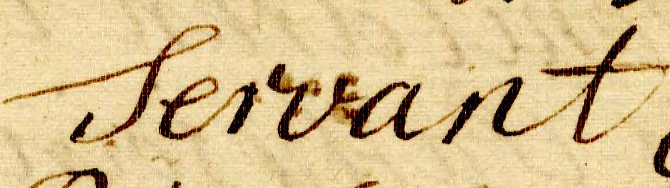Servant
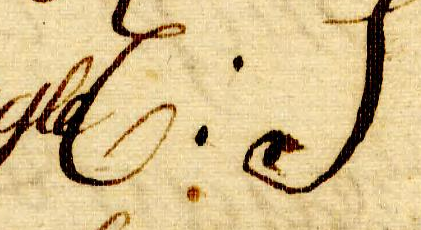E:S
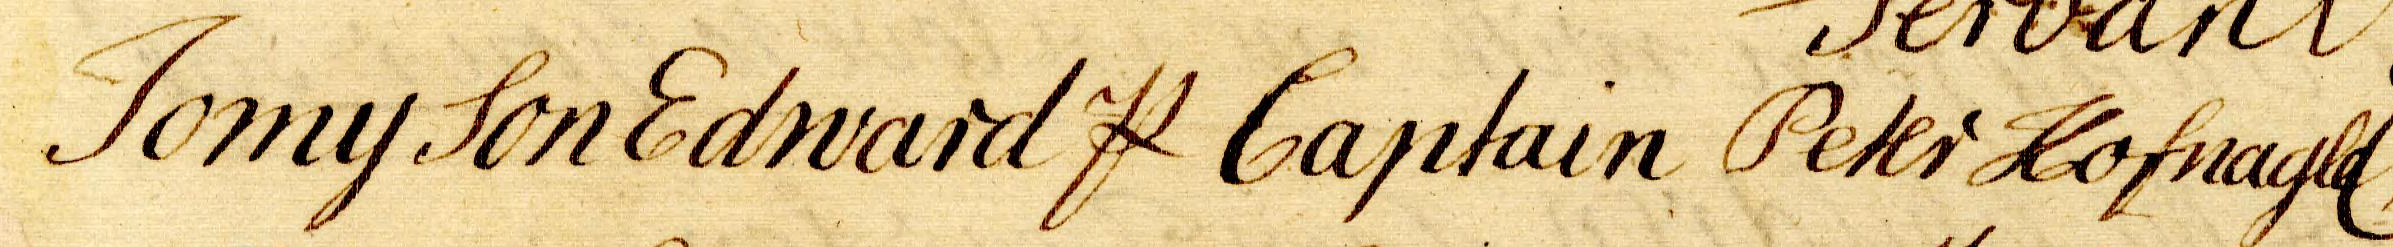To my Son Edward per Captain Peter Hofnagle
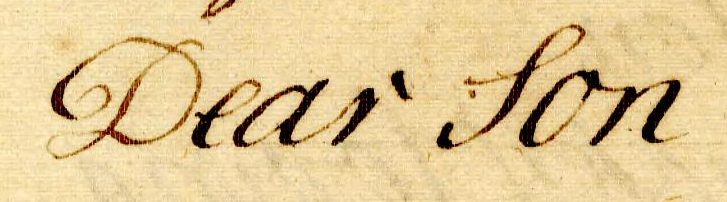Dear Son
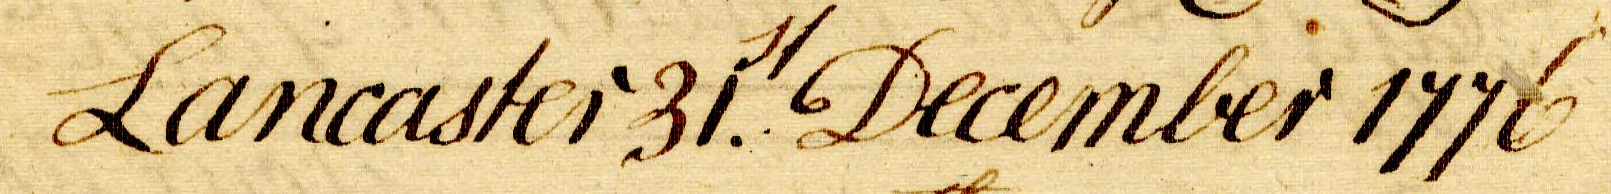Lancaster 31.^st December 1776
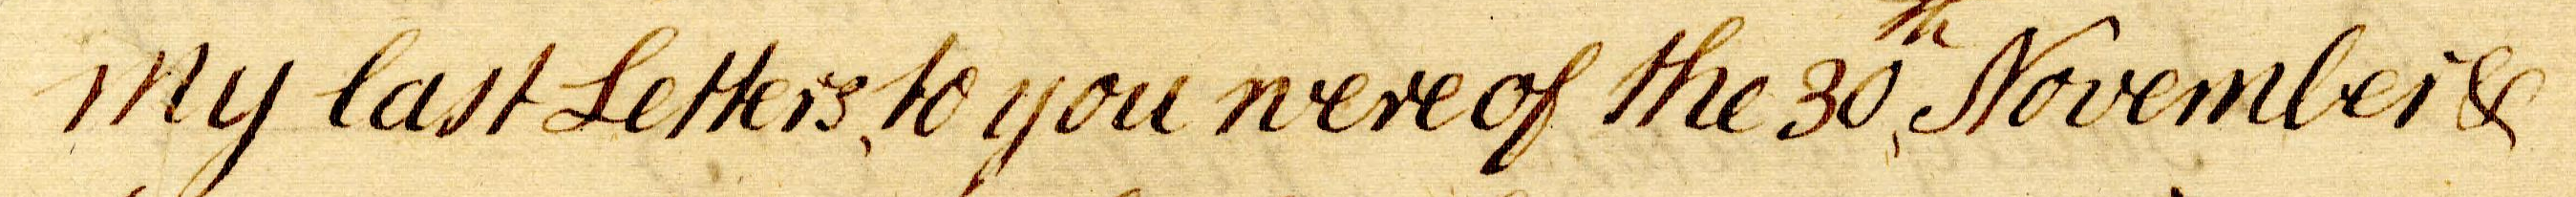My last Letters to you were of the 30^th November &
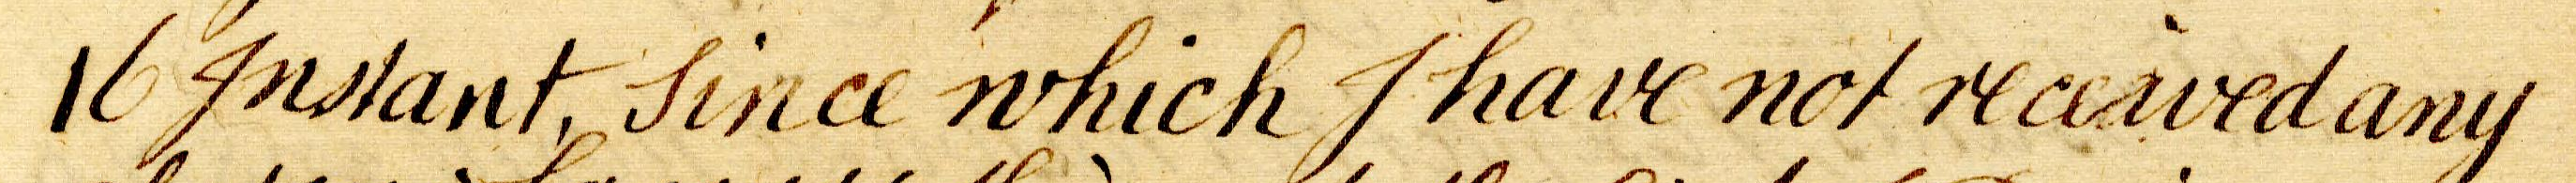16 Instant, Since which I have not received any
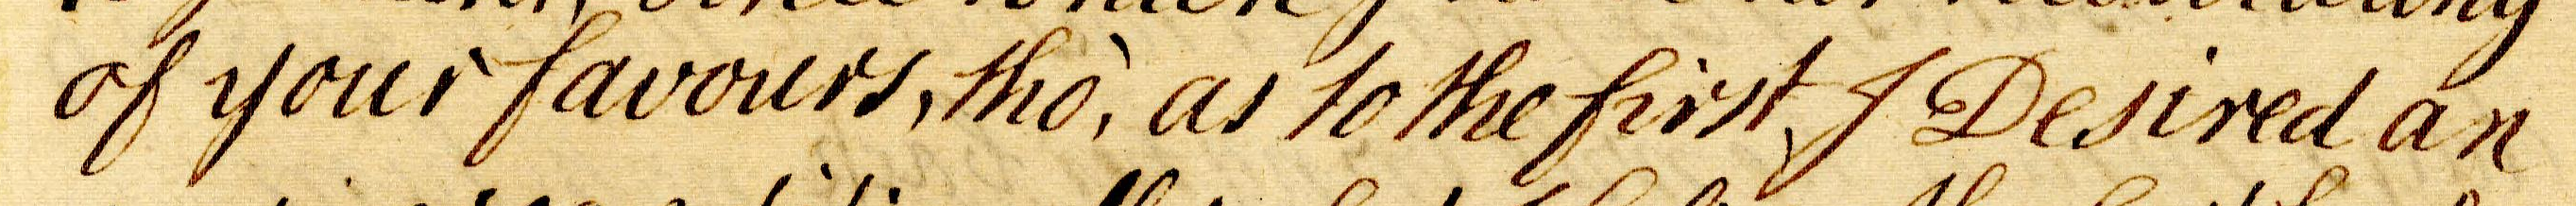of Your favours, tho', as to the first I Desired an
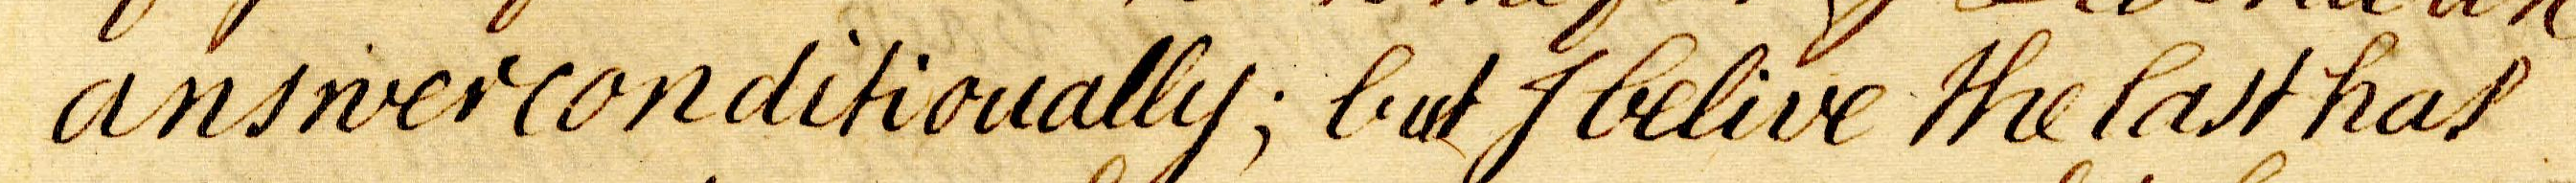answer conditionally; but I belive the last has
